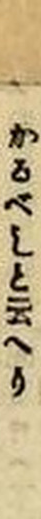かるべしと云へり
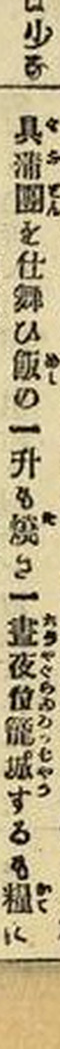具蒲團を仕舞ひ飯の一升も燒き一晝夜位籠城するも糧に
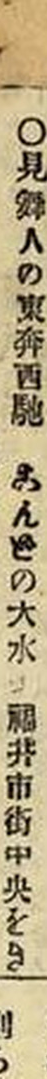○見舞人の東奔西馳こんどの大水は福井市街中央をき
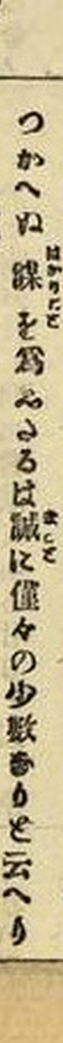つかへぬ謀を爲したるは誠に僅々の少數なりと云へり
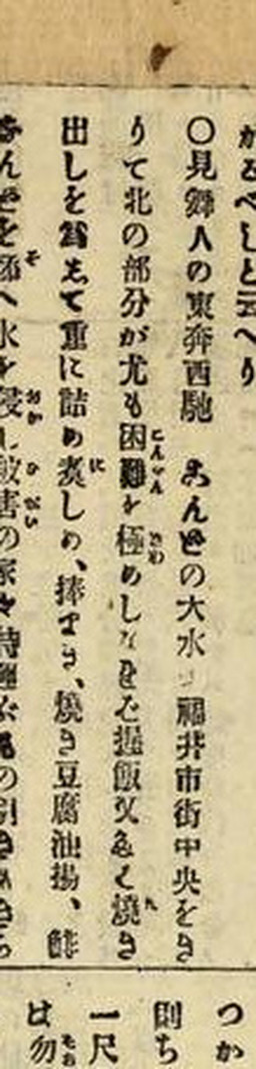りて北の部分が尤も困難を極めしなれば握飯又たは燒き
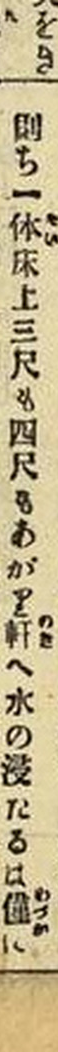則ち一体床上三尺も四尺もあがり軒へ水の浸たるは僅に
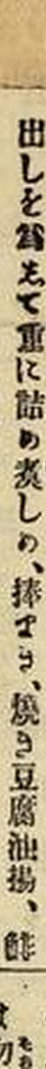出しを爲して重に詰め煑しめ、棒まき、燒き豆腐油揚、鮨
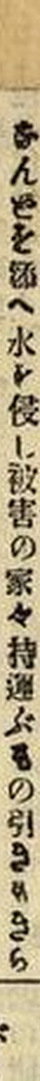なんとを添へ水を侵し被害の家々持運ぶもの引きもきら
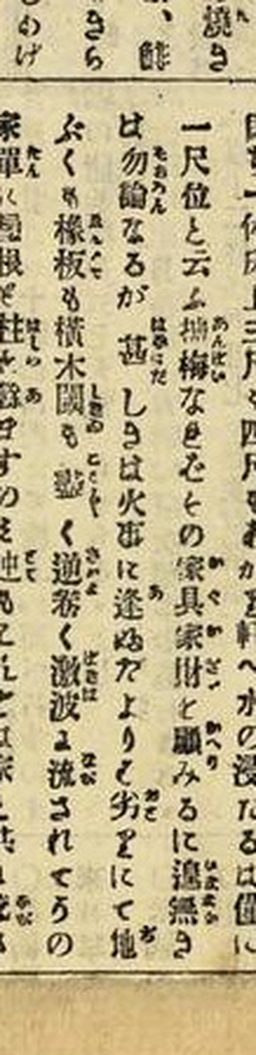は勿論なるが甚しきは火事に逢ふたよりは劣りにて地
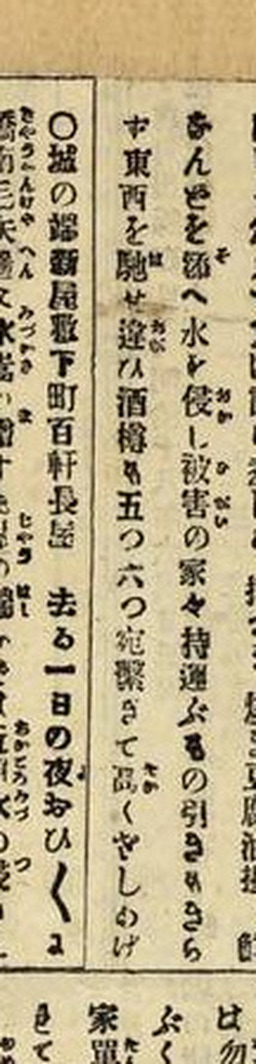す東西を馳せ違ひ酒樽も五つ六つ宛繋ぎて高くさしあげ
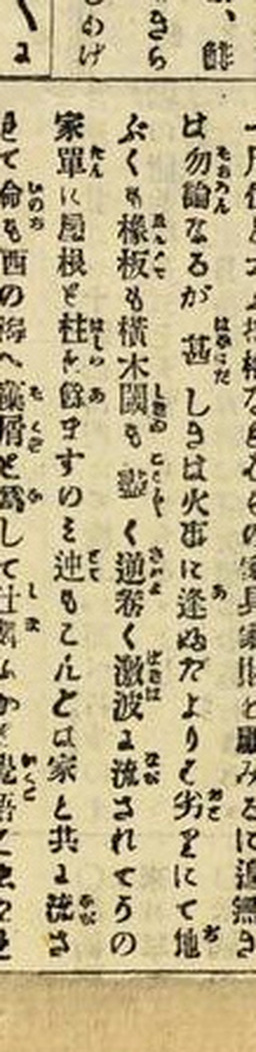ぶくも椽板も横木閾も盡く逆卷く激波に流されてかの
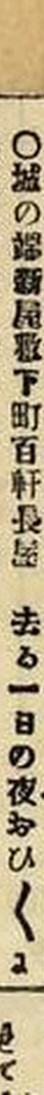○城の端新屋敷下町百軒長屋去る一日の夜おひ〳〵に
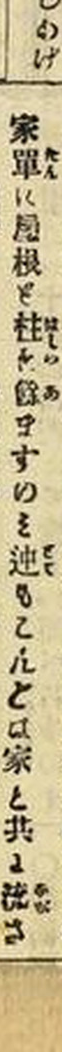家單に屋根と柱を豫ますのみ迚もこんどは家と共に流さ
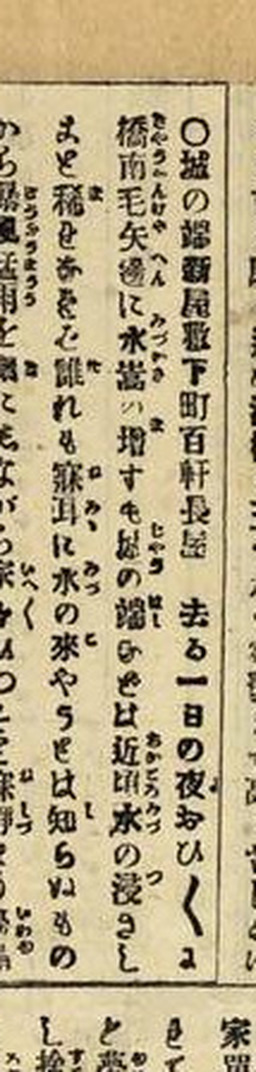橋南毛矢邊に水嵩の増すも城の端などは近頃水の浸きし
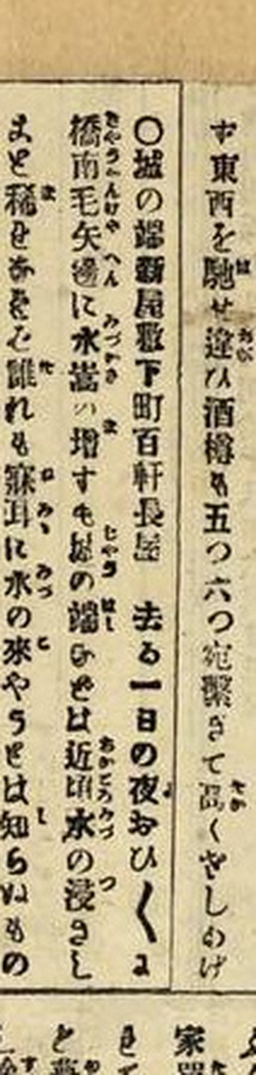○城の端新屋敷下町百軒長屋去る一日の夜おひ〳〵に
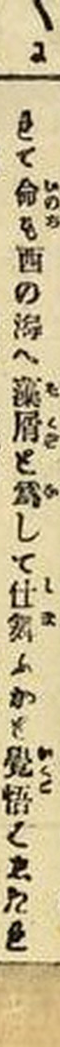れて命も西の潟へ藻屑と爲して仕舞ふかと覺悟はしたれ
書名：温古集 五巻
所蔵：福井県文書館 Fukui Prefectural Archives
